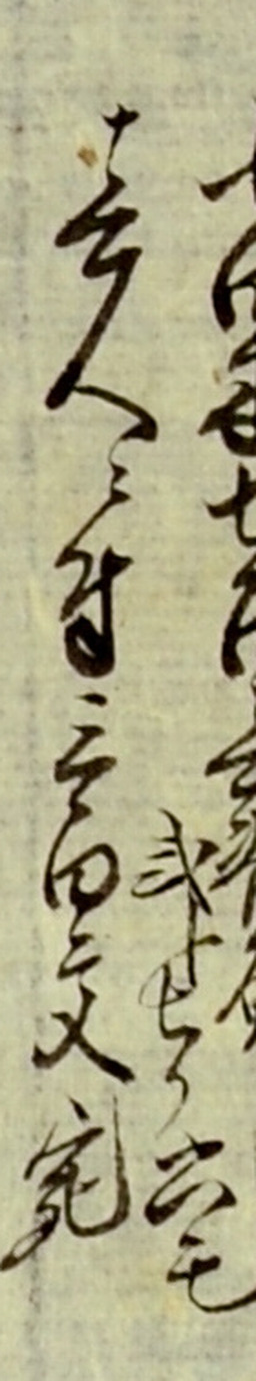壱人ニ付三百文宛
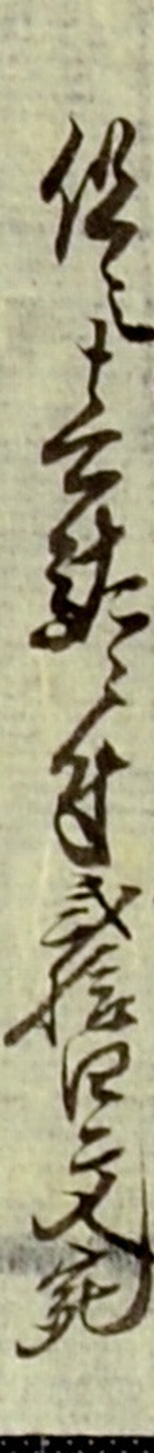但シ壱駄ニ付弐拾四文宛
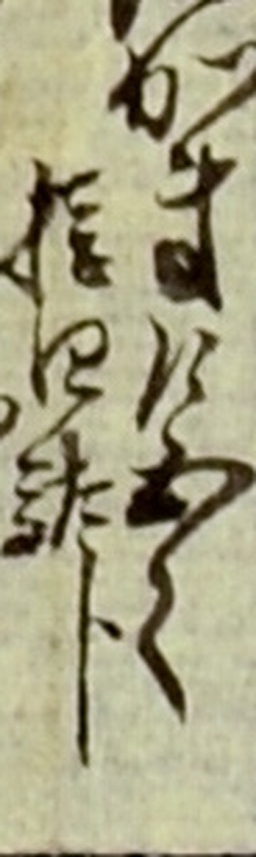拾四駄歩
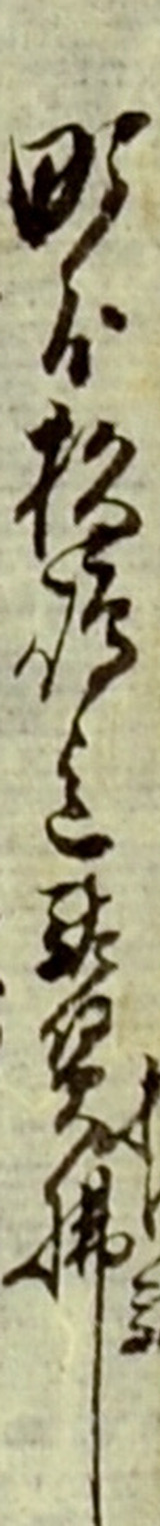町ヨリ松嶋迄駄賃払
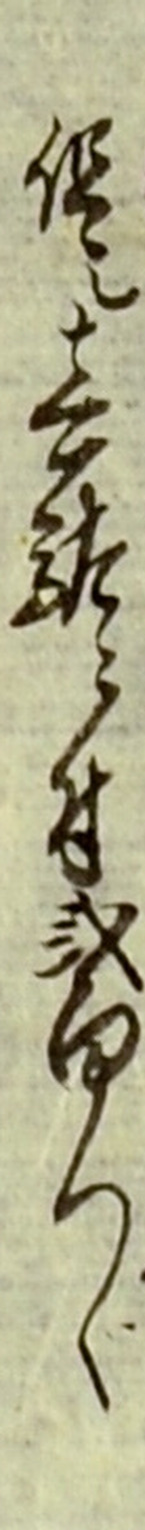但シ壱駄ニ付弐百つゝ
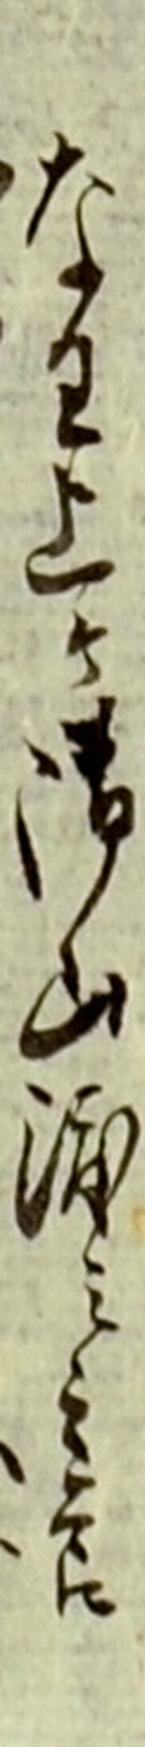なわ上ケ御山渡シ之節
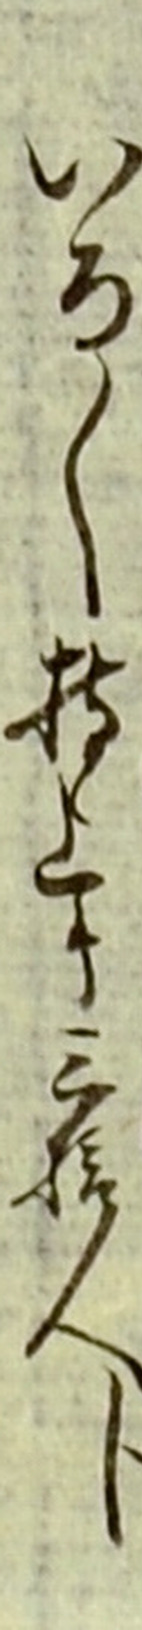いろいろ持上ケ三拾人歩
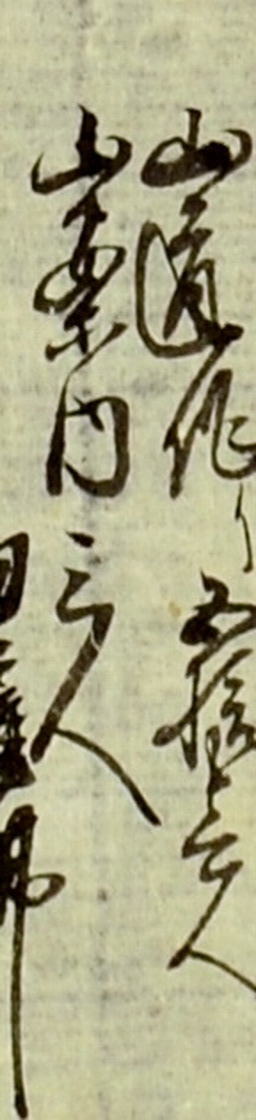山案内三人
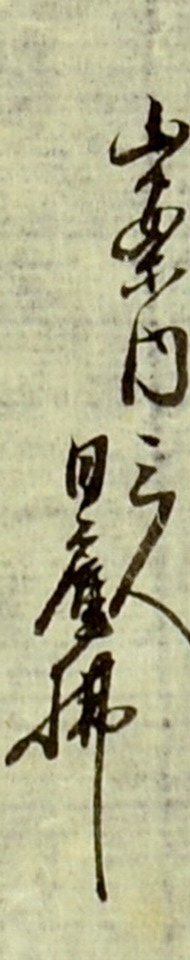山案内三人
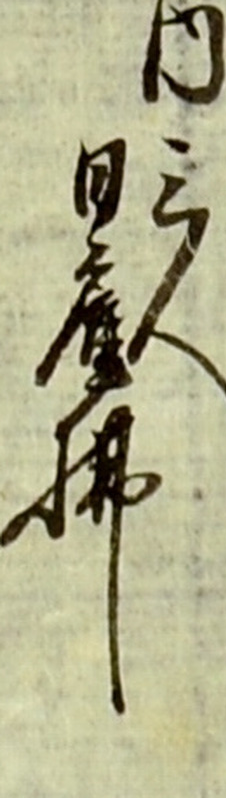日雇払
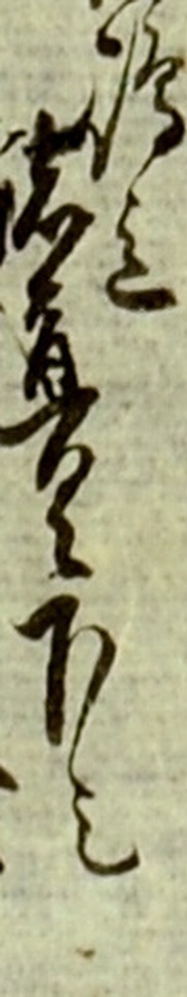諸道具下シ
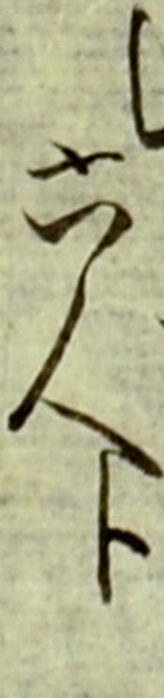六人歩
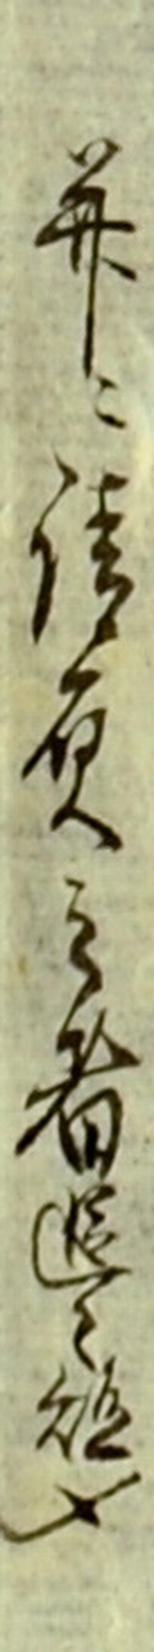并ニ請負之者追々賄〆
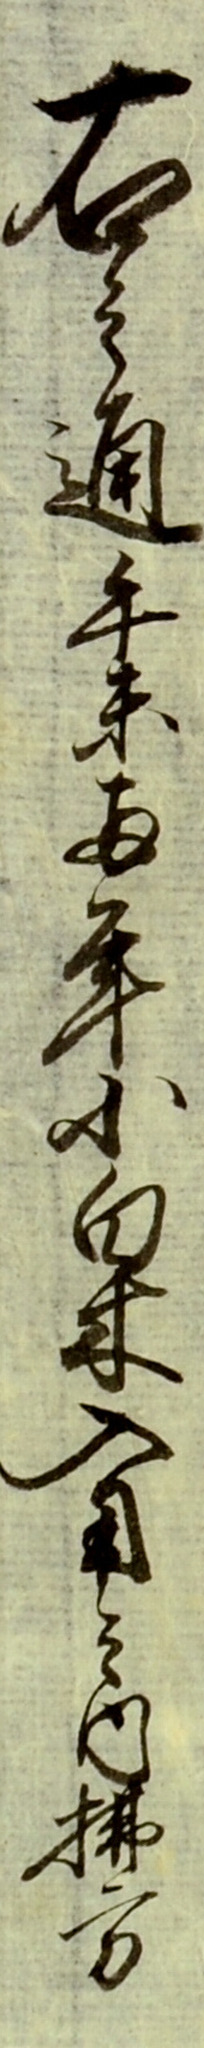右之通午未両年小白木入用之内払方
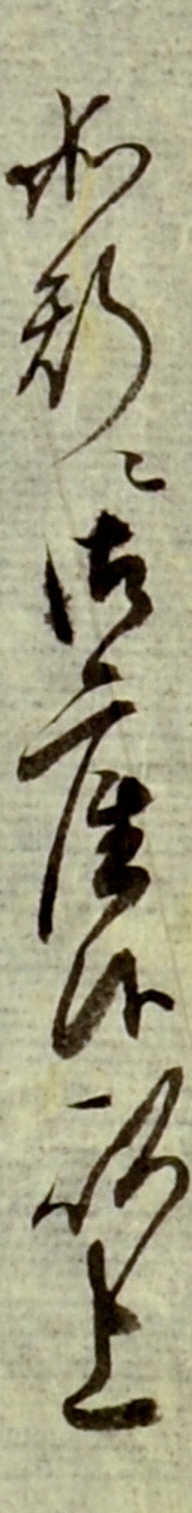如斯ニ御座候以上
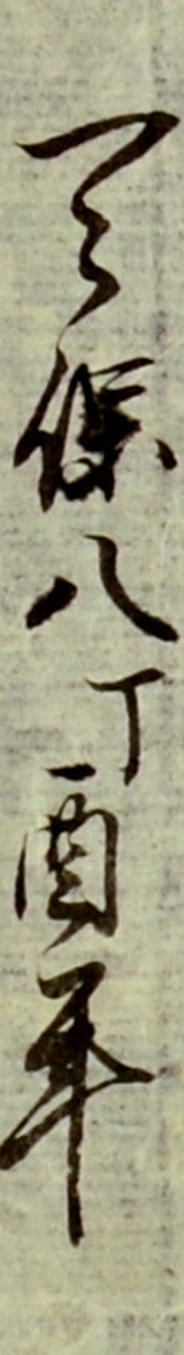天保八丁酉年
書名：覚
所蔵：伊那市立高遠町図書館・合同会社AMANE
